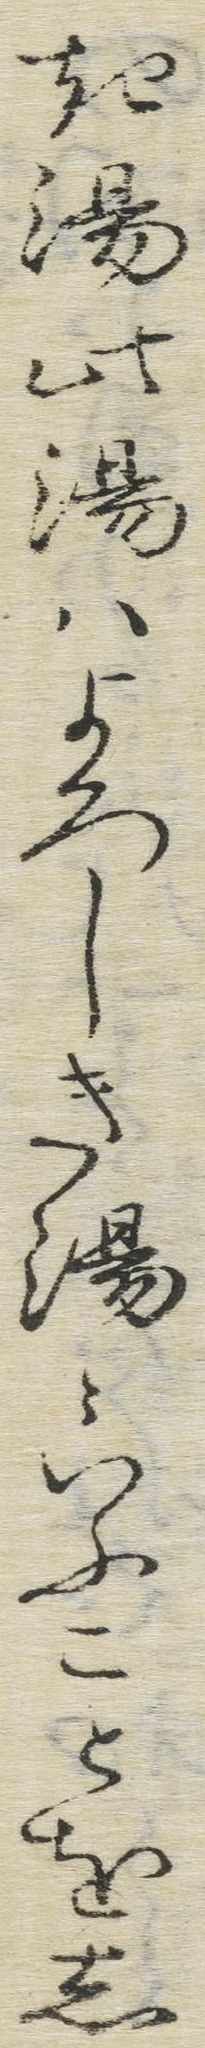き湯此湯はよろしき湯といふことをし
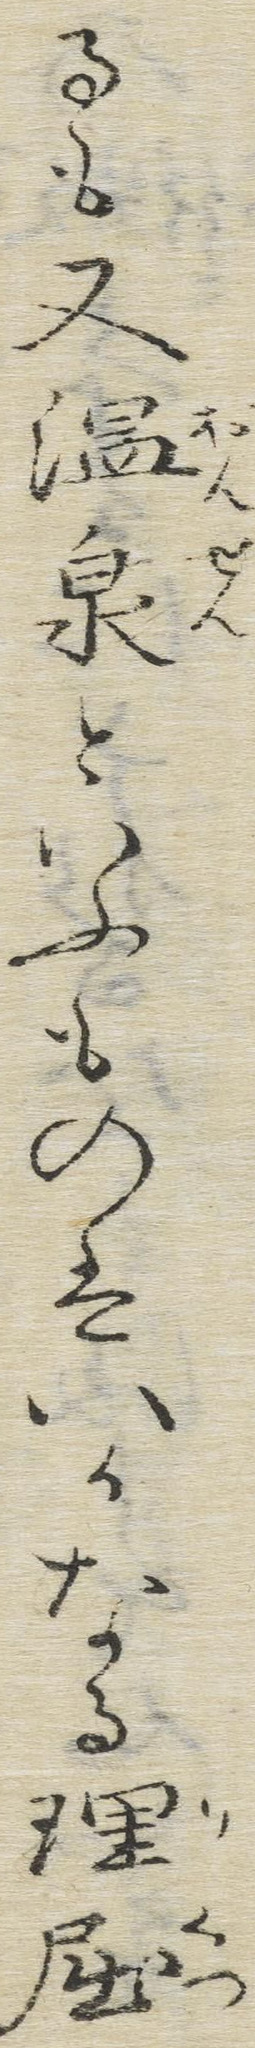るも又温泉といふものはいかなる理屈
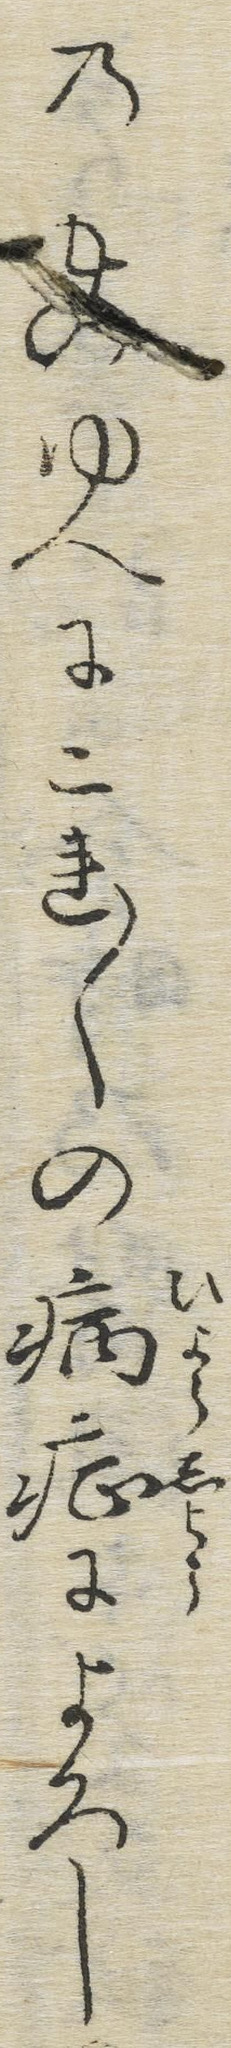のものゆへにこれ〳〵の病症によろし
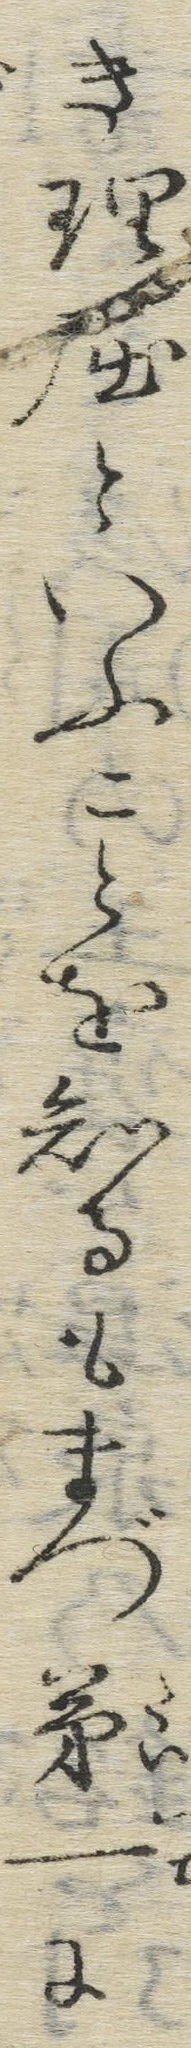き理屈といふことを知るもまづ第一に
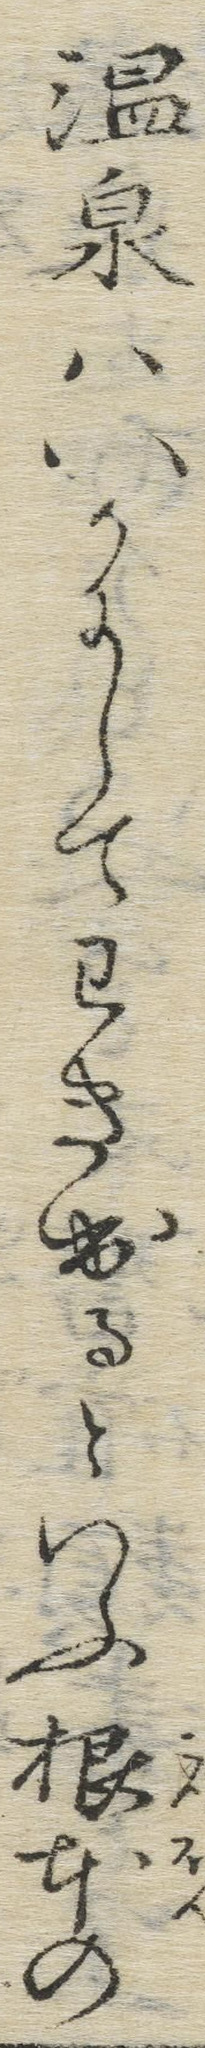温泉はいかにしてわき出るといふ根本の
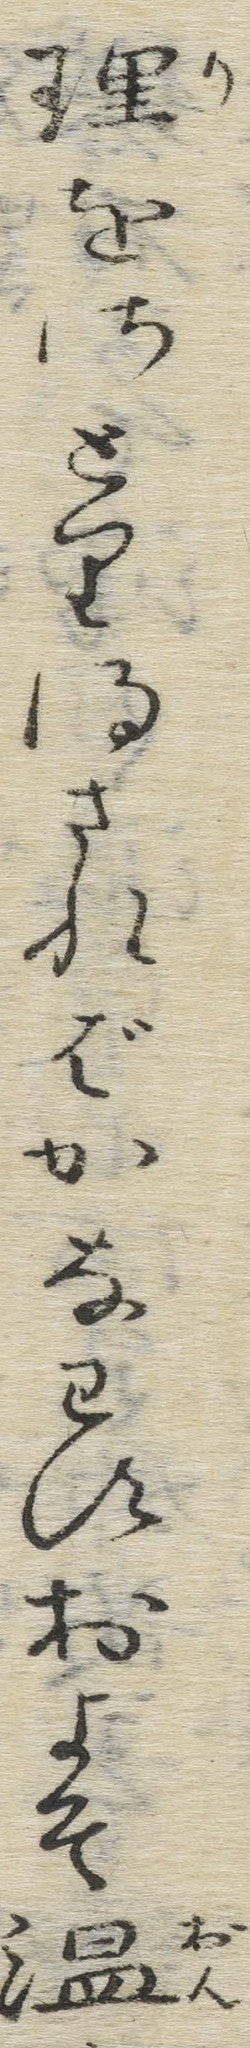理をさとり得さればかなわすおよそ温
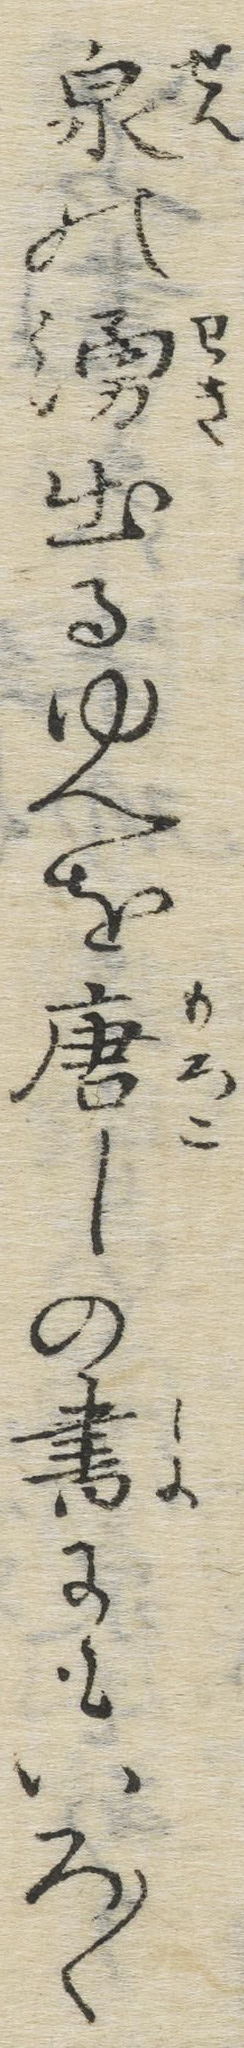泉の湧出るゆへを唐しの書にもいろ〳〵
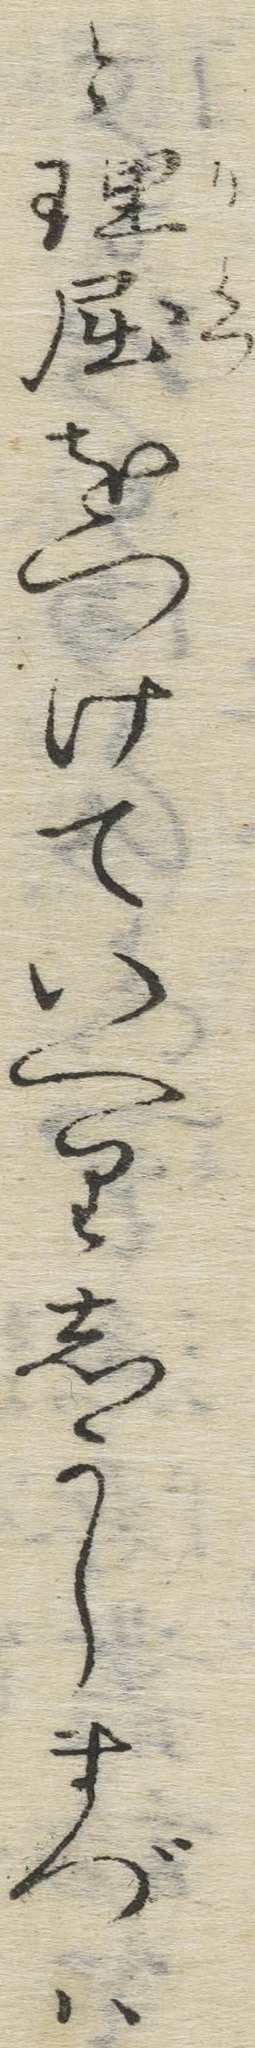と理屈をつけていへりしかしまづは
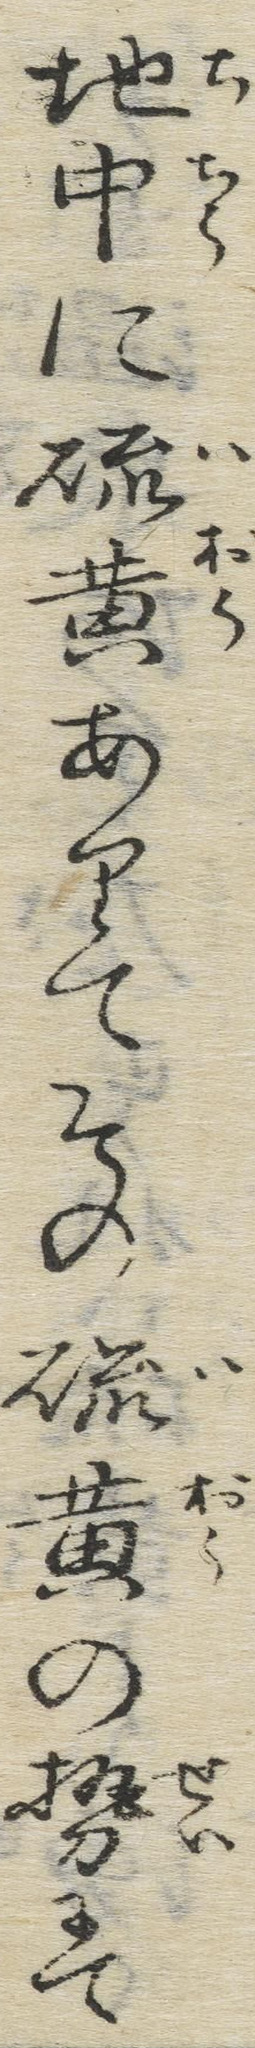地中に硫黄ありてその硫黄の勢にて
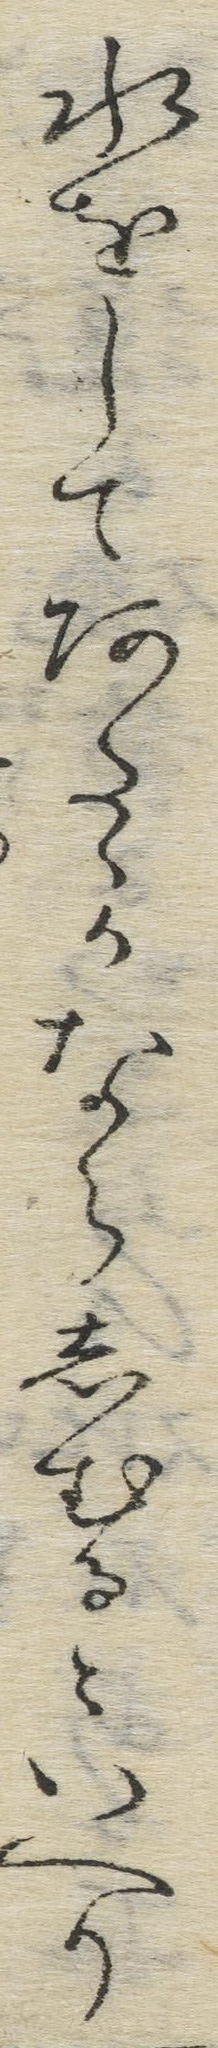水をしてあたゝかならしむるといへり
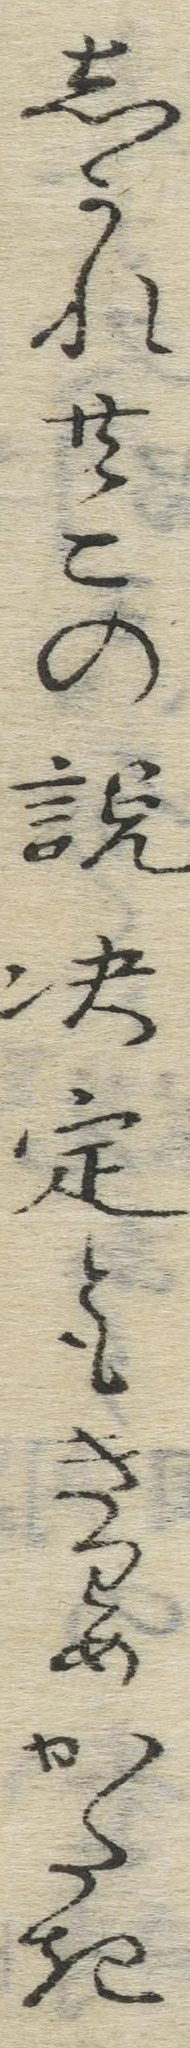しかれ共この説決定ともきわめかたき

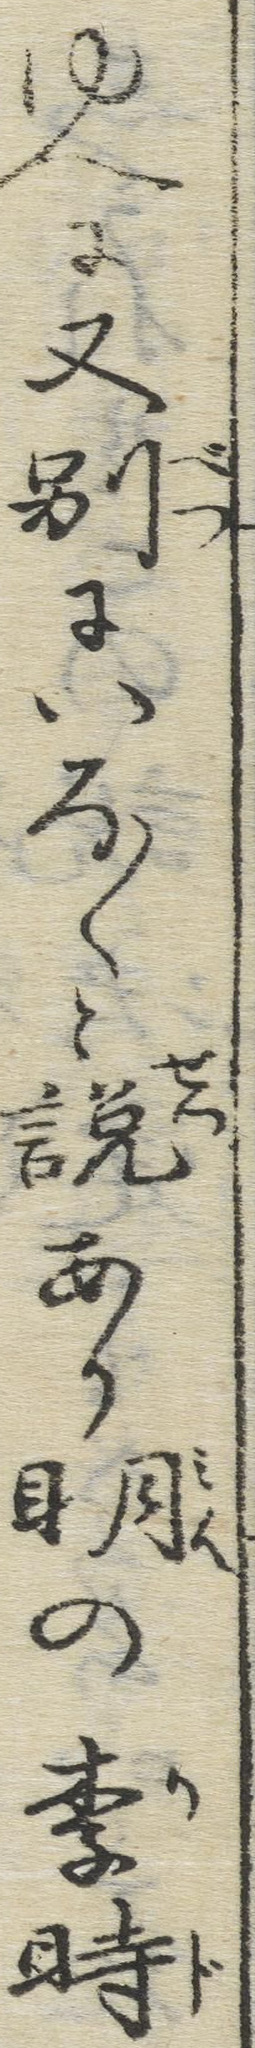ゆへに又別にいろ〳〵と説あり明の李時
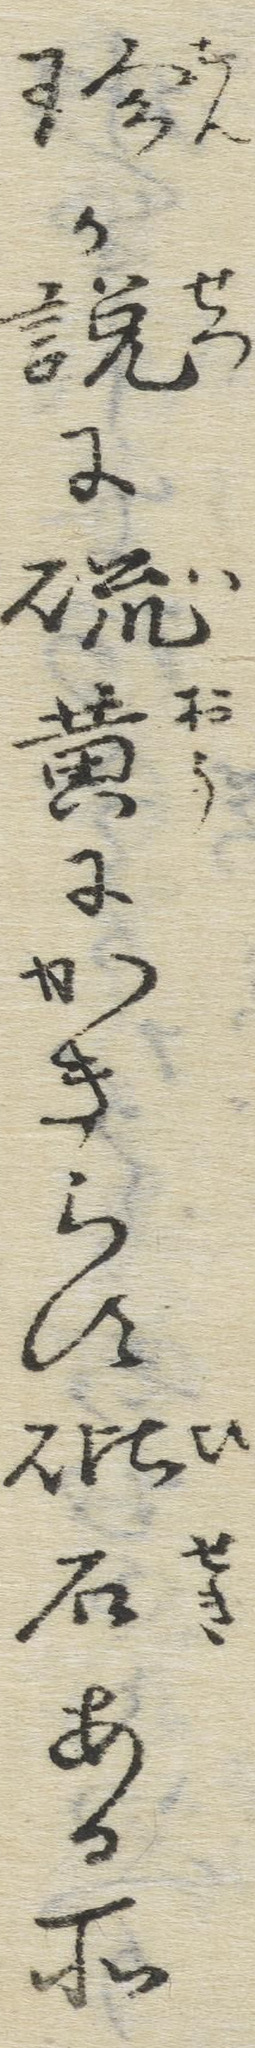珍か説に硫黄にかきらす砒石ある所
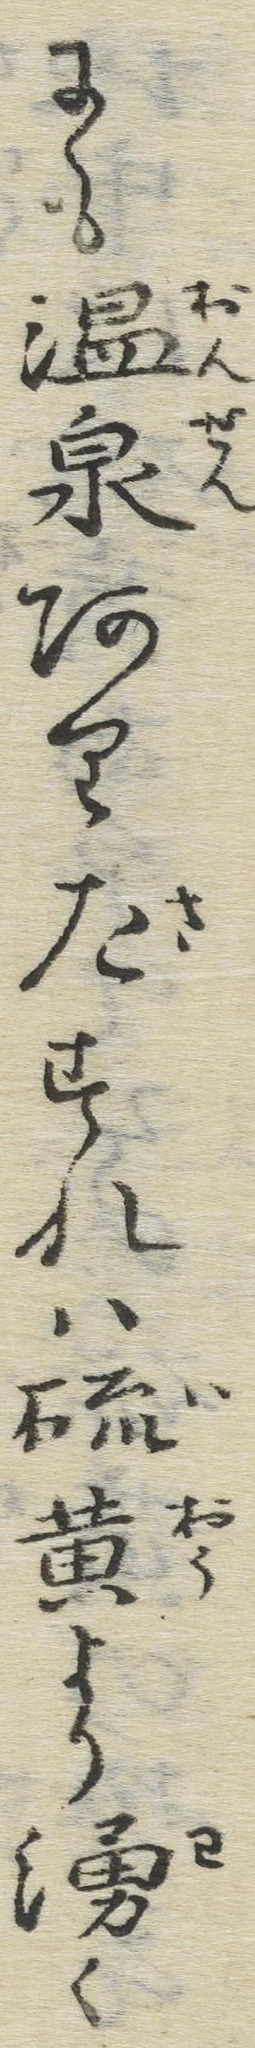にも温泉あり左すれは硫黄より湧く
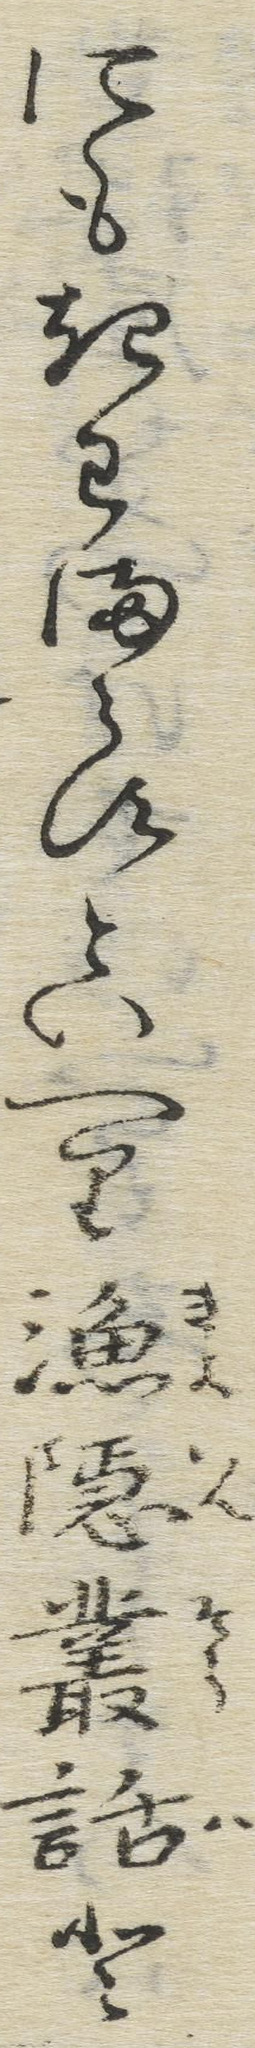にもきわまらすといへり漁隠叢話と
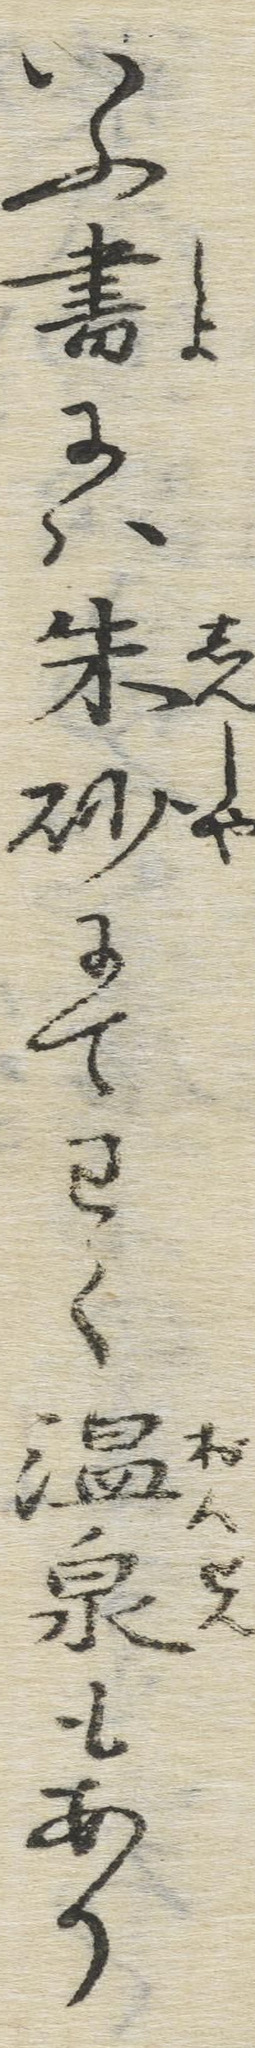いふ書には朱砂にてわく温泉もあり
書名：温泉考
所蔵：東京大学地震研究所図書室 Earthquake Research Institute Library, The University of Tokyo, JAPAN
